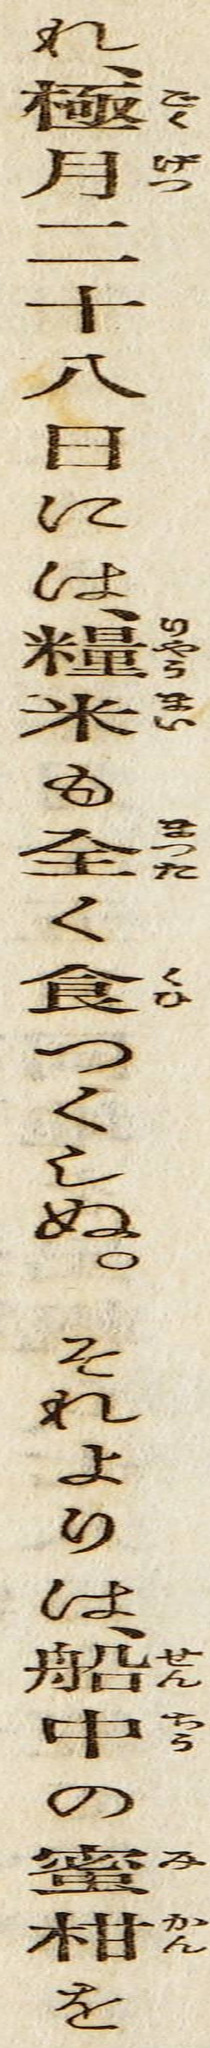れ、極月二十八日には、糧米も全く食つくしぬ。それよりは、船中の蜜柑を
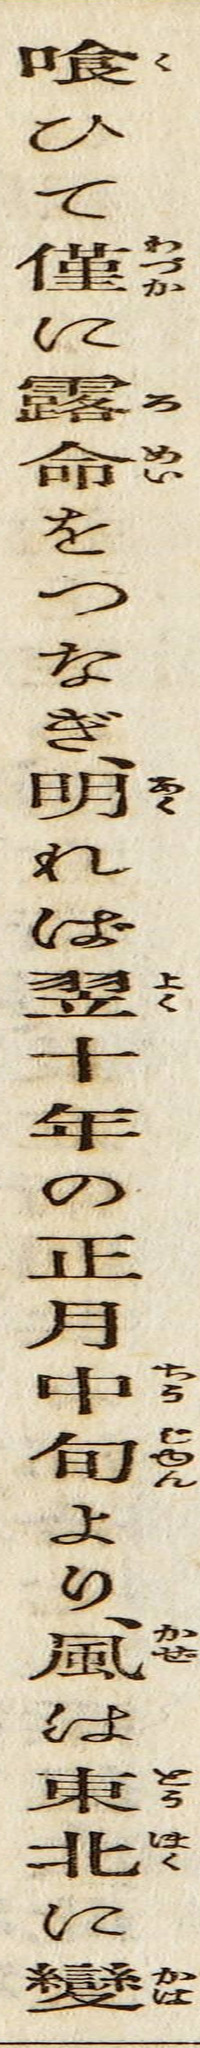喰ひて僅に露命をつなぎ、明れば翌十年の正月中旬より、風は東北に変
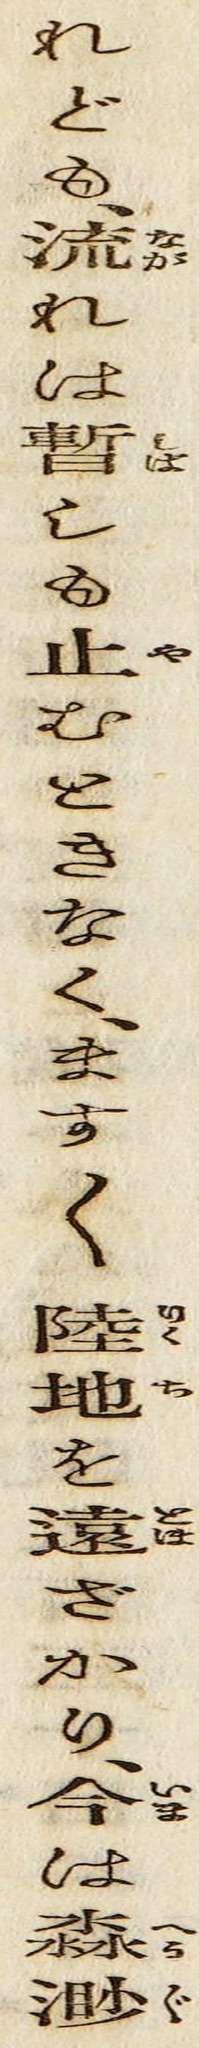れども、流れは暫しも止むときなく、ます〳〵陸地を遠ざかり、今は淼渺
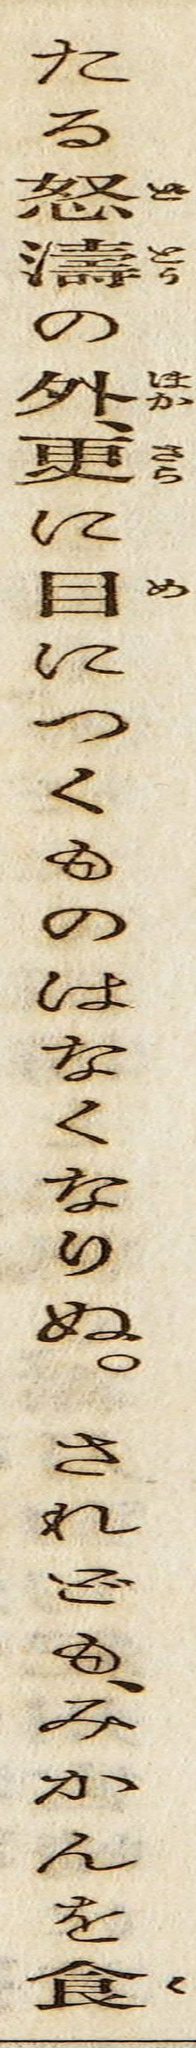たる怒濤の外、更に目につくものはなくなりぬ。されども、みかんを食
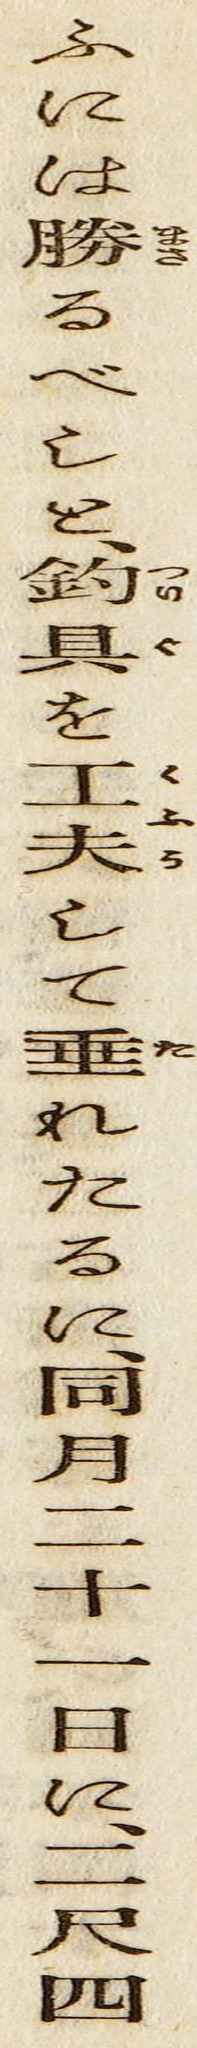ふには勝るべしと、釣具を工夫して垂れたるに、同月二十一日に、二尺四
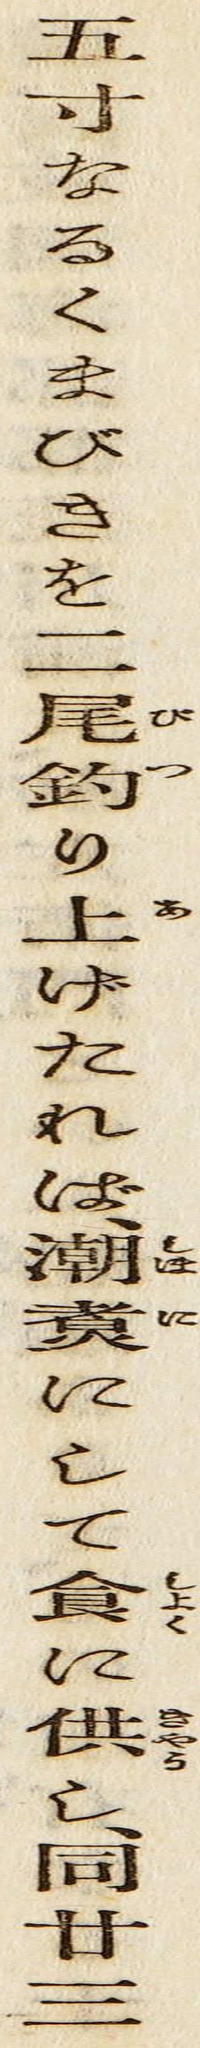五寸なるくまびきを二尾釣り上げたれば、潮煮にして食に供し、同廿三
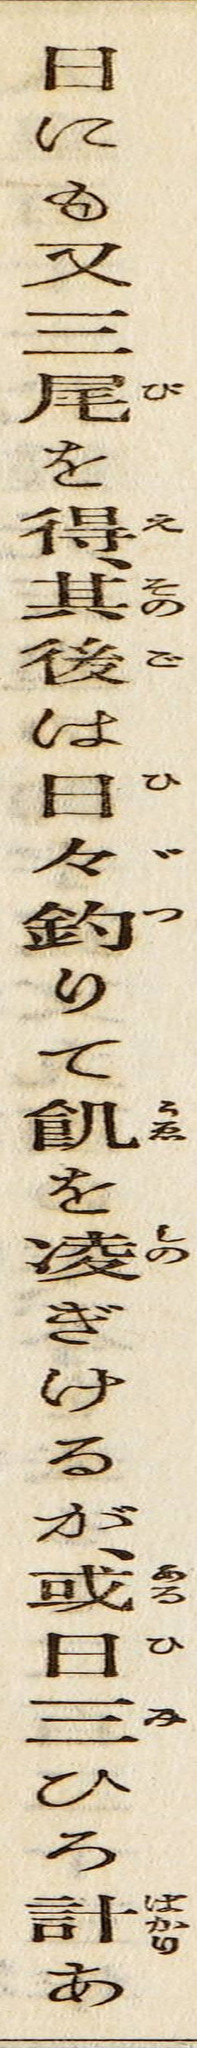日にも又三尾を得、其後は日々釣りて飢を凌ぎけるが、或日三ひろ計あ
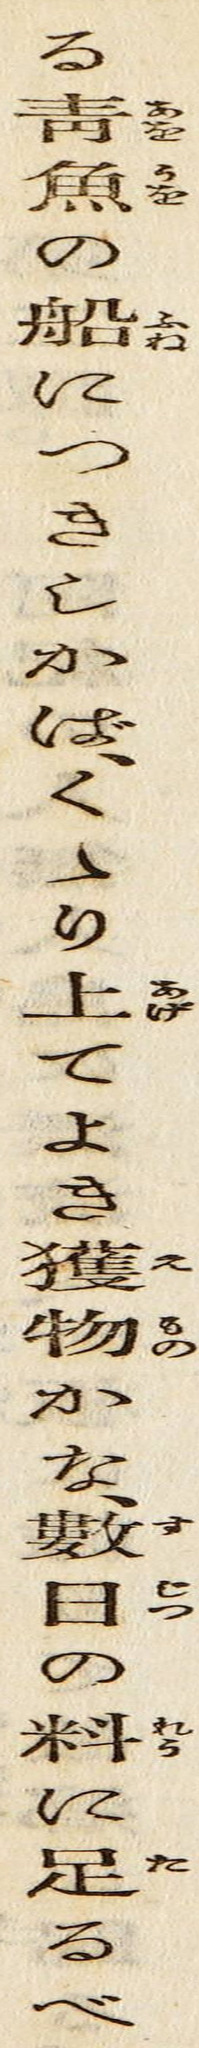る青魚の船につきしかば、くゝり上てよき獲物かな、数日の料に足るべ
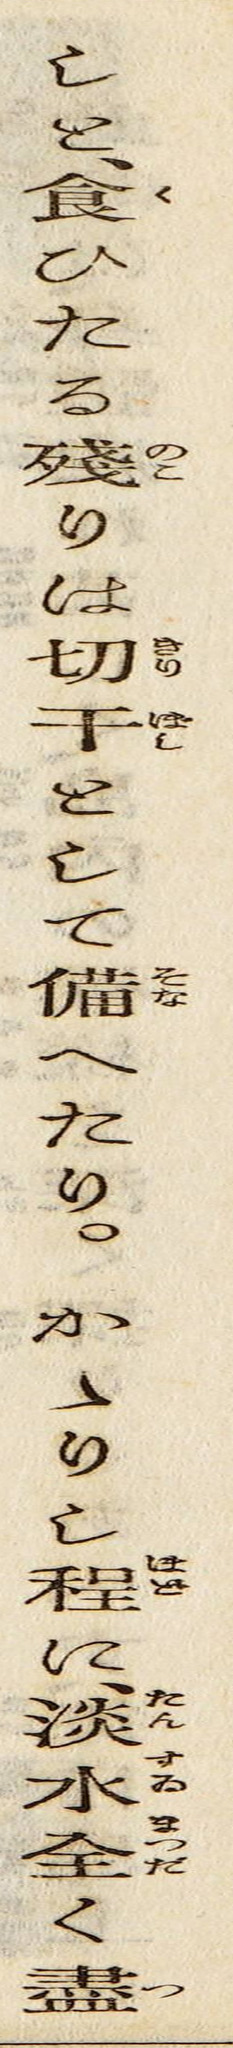しと、食ひたる残りは切干として備へたり。かゝりし程に、淡水全く尽
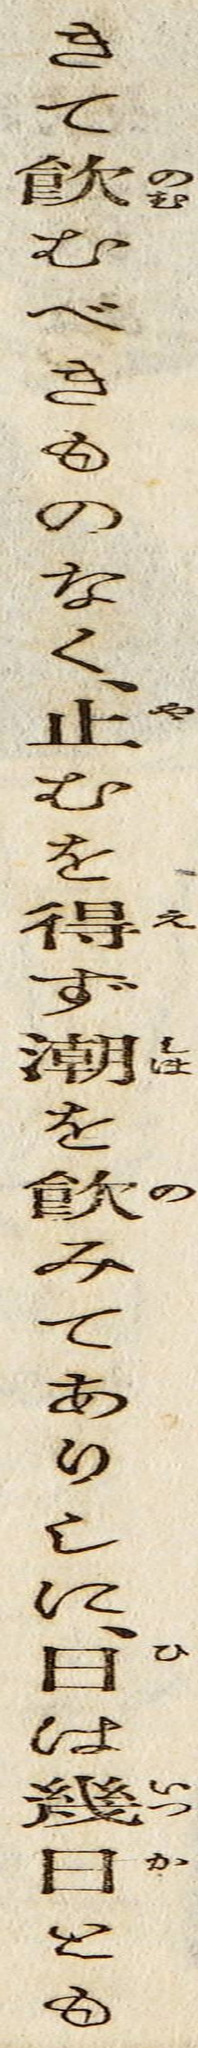きて飲むべきものなく、止むを得ず潮を飲みてありしに、日は幾日とも
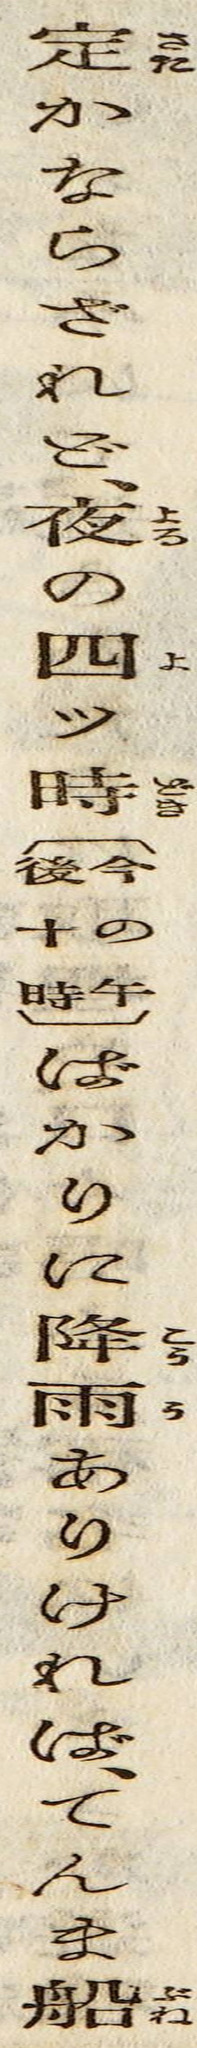定かならざれど、夜の四ツ時[今の午後十時]ばかりに降雨ありければ、てんま船
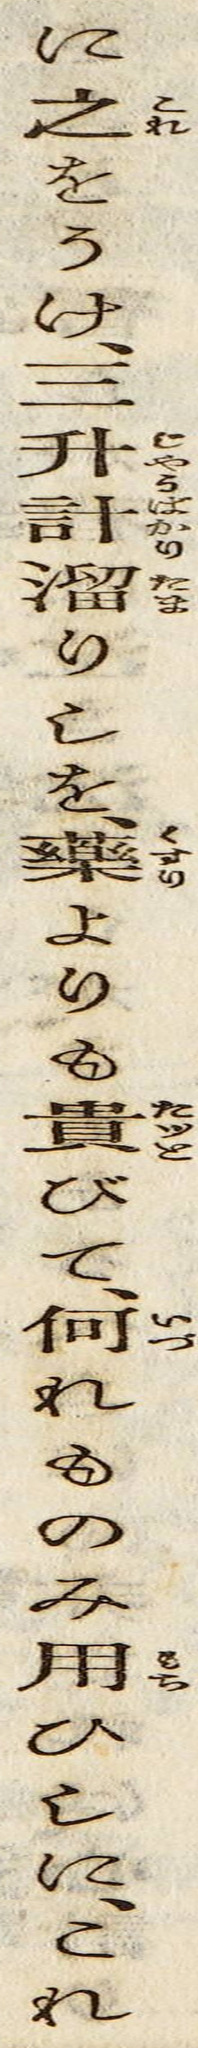に之をうけ、三升計溜りしを、薬よりも貴びて、何れものみ用ひしに、これ
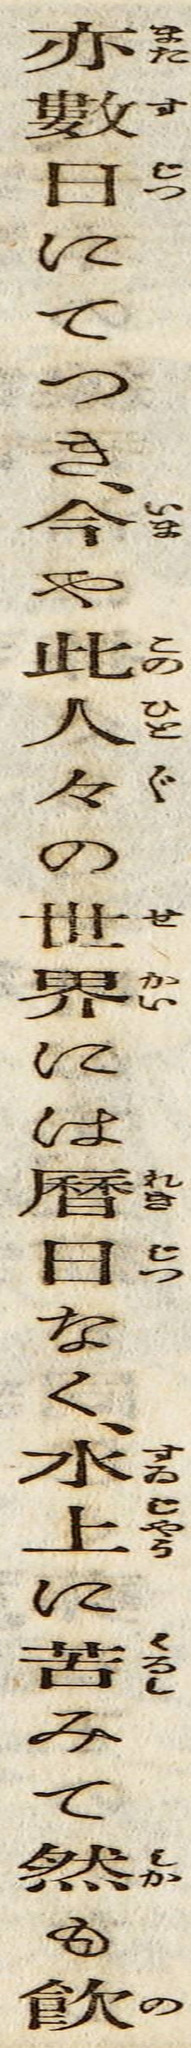亦数日にてつき、今や此人々の世界には暦日なく、水上に苦みて然も飲
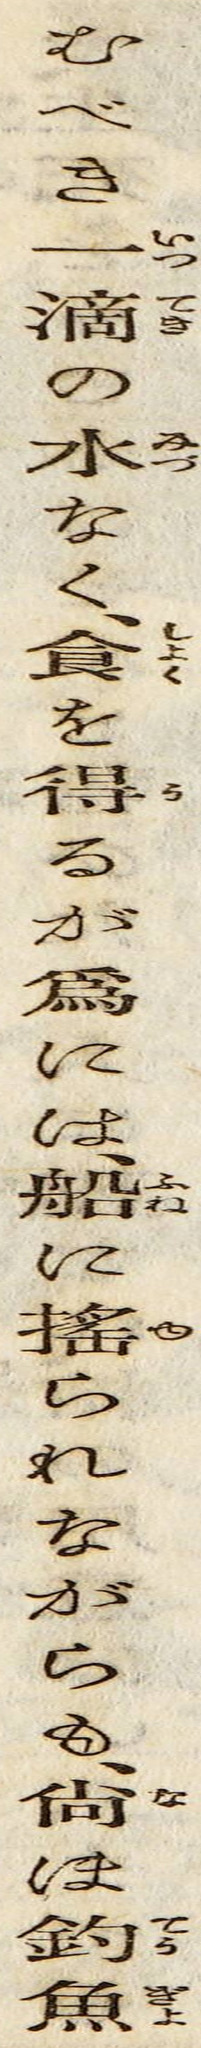むべき一滴の水なく、食を得るが為には、船に揺られながらも、尚ほ釣魚
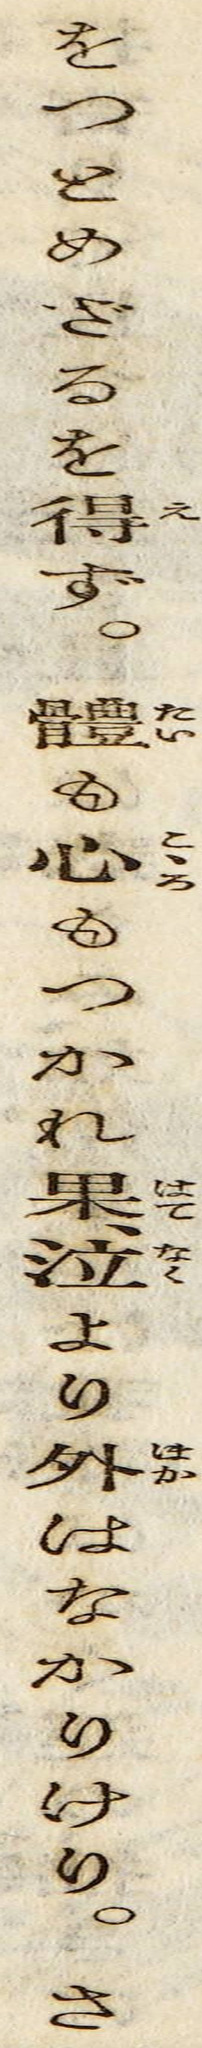をつとめざるを得ず。体も心もつかれ果、泣より外はなかりけり。さ
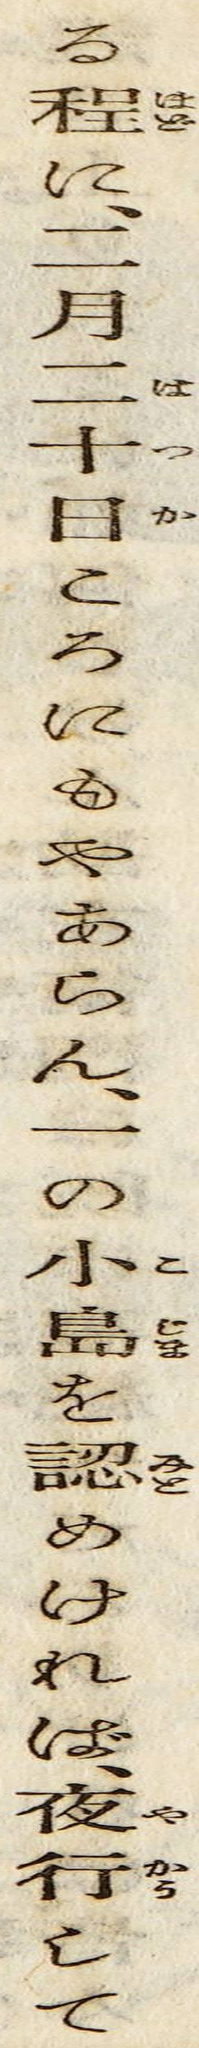る程に、二月二十日ころにもやあらん、一の小島を認めければ、夜行して
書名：日本漂流譚
